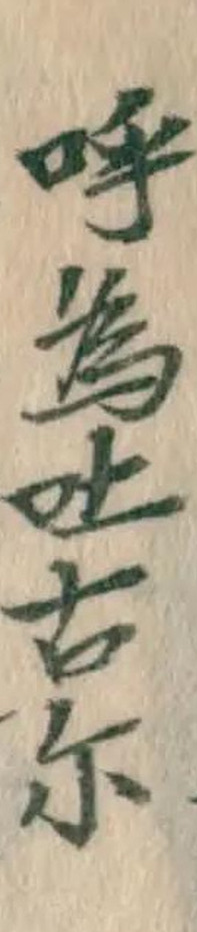呼為吐古尓
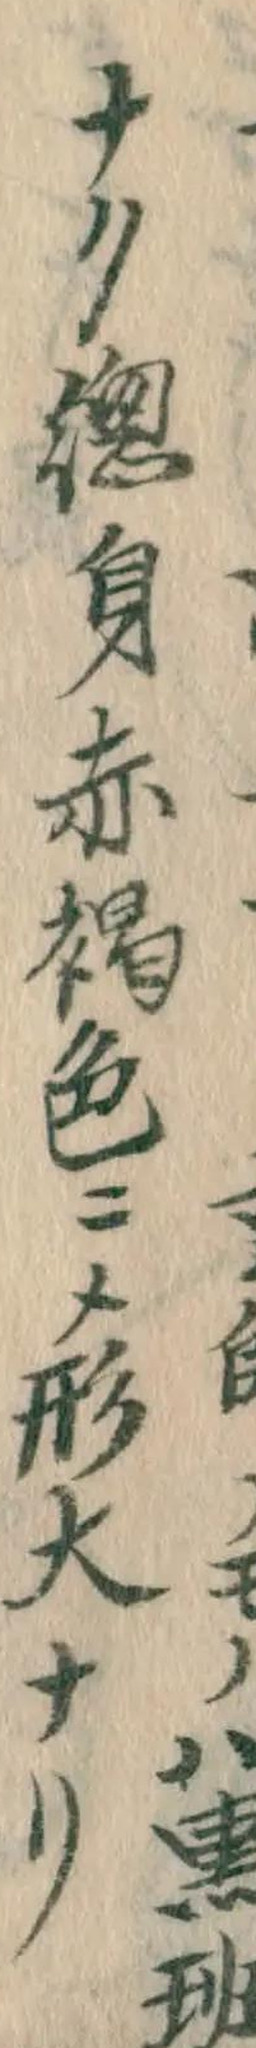ナク總身赤褐色ニシテ形大ナリ
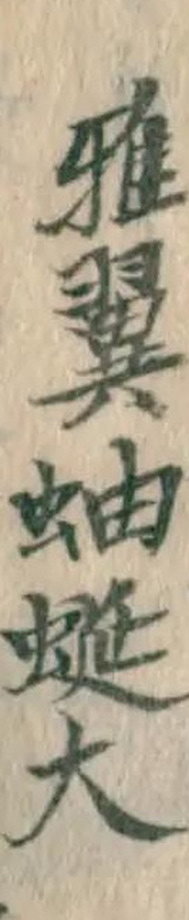雅翼蚰蜒大
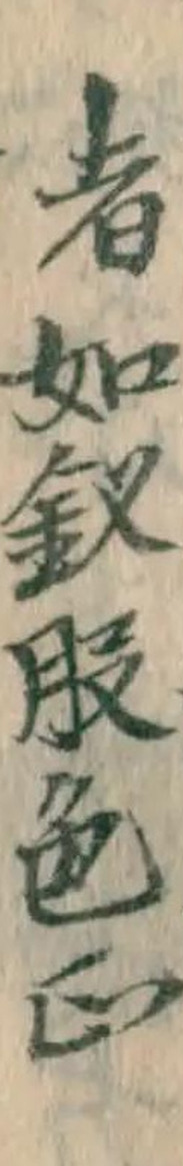者如釵服色正
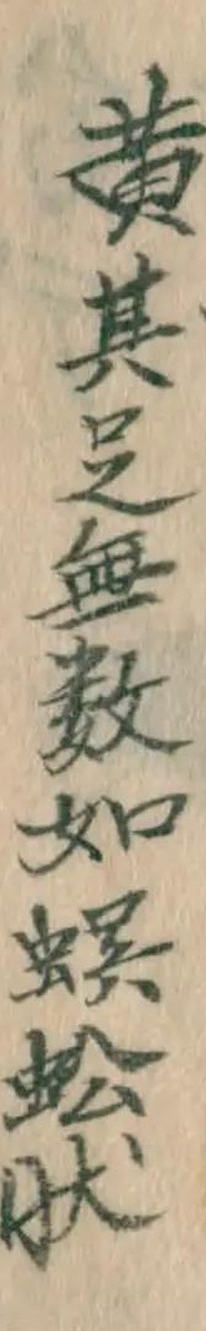黄其足無数如蜈蚣状

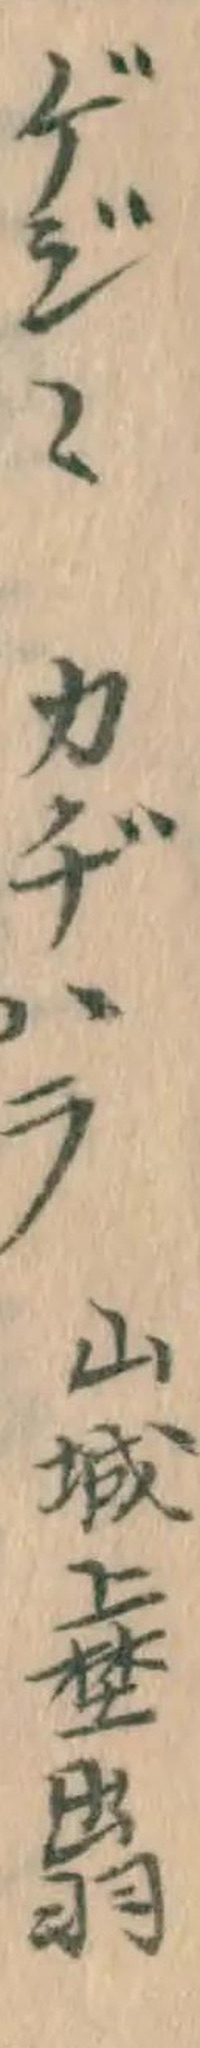ゲジ〳〵カヂハラ山城上埜出羽
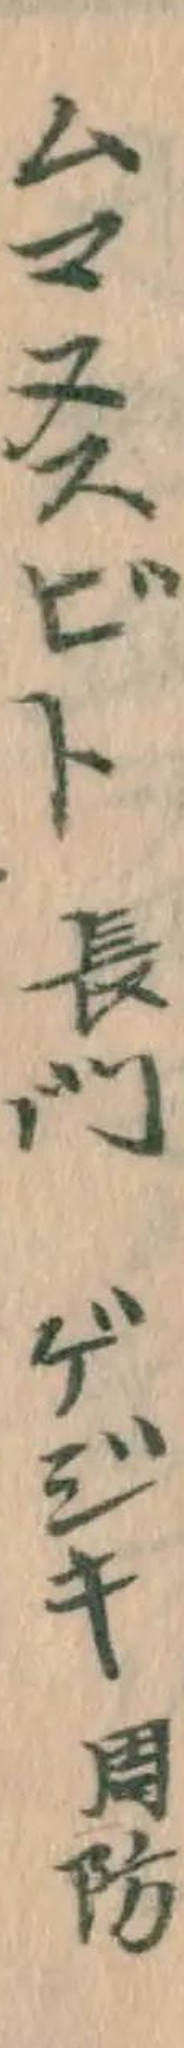ムマヌスビト長門ゲジキ周防
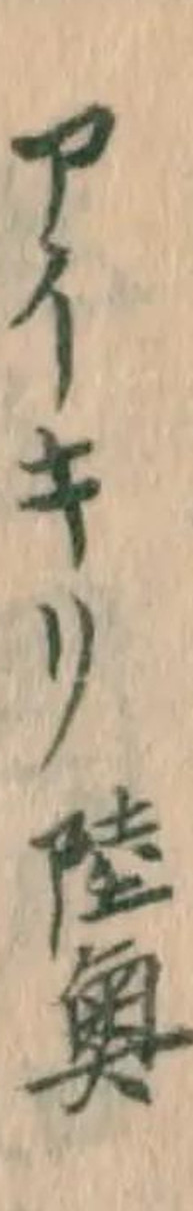アイキリ陸奥
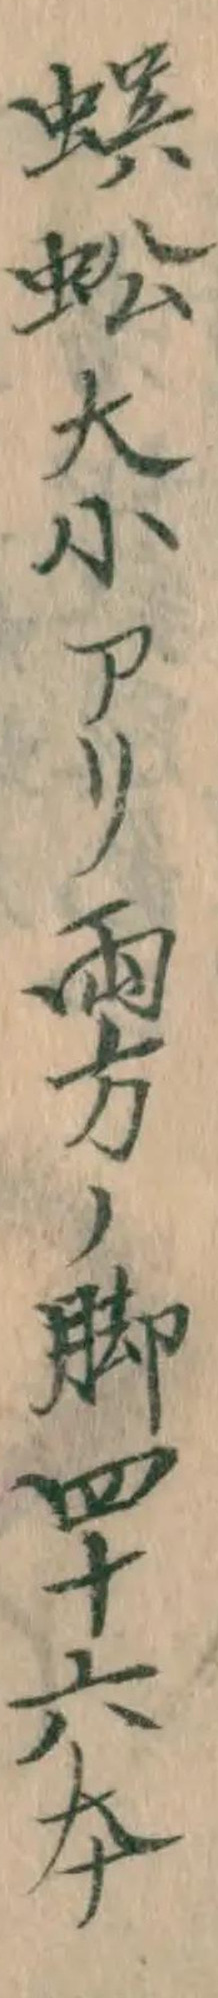蜈蚣大小アリ両方ノ脚四十六本
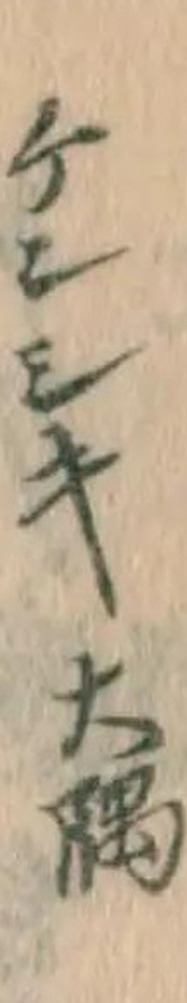ケンシキ大隅
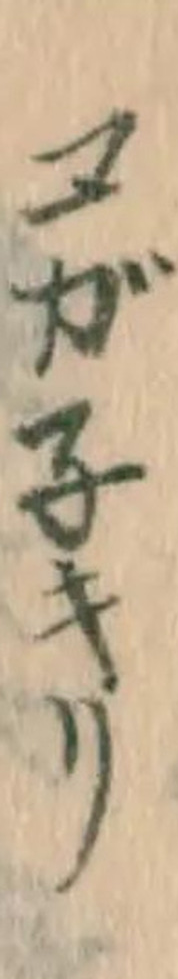コガネキリ
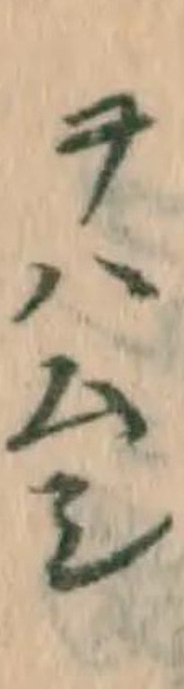ヲハムシ
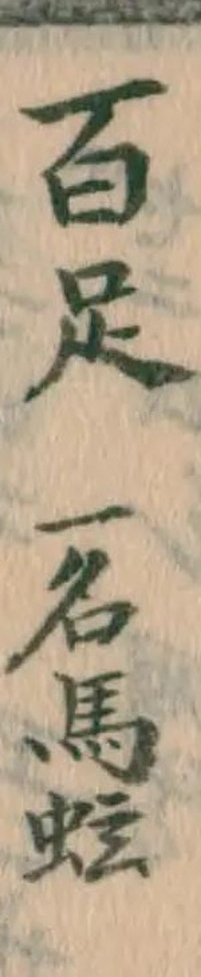百足一名馬蚿
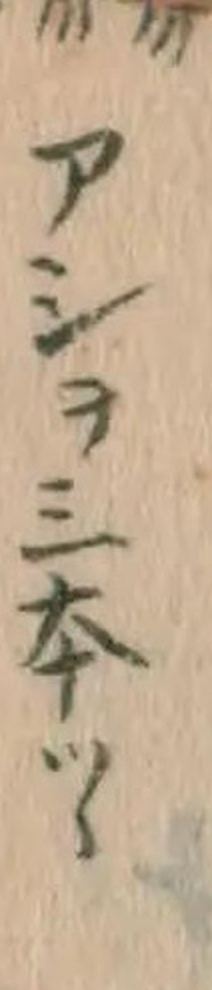アシヲ三本ツヽ
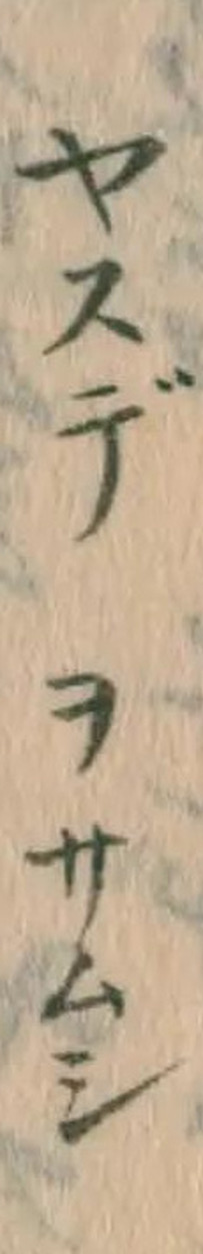ヤスデヲサムシ
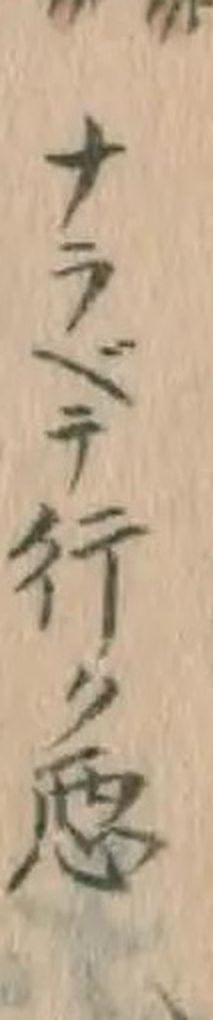ナラベテ行ク悪
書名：千蟲譜 3巻. [1]
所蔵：国立国会図書館 National Diet Library, JAPAN
